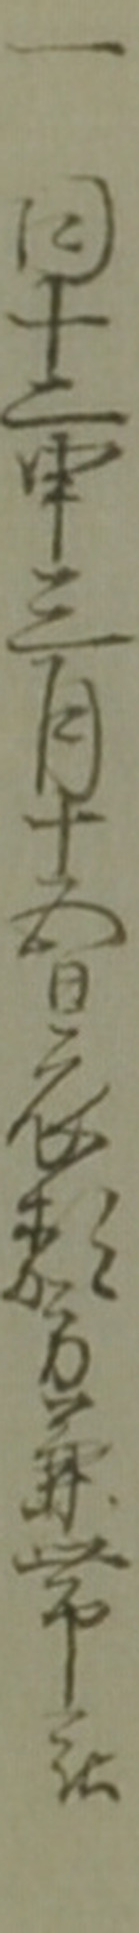一同十二申三月十五日衣類方兼帯被
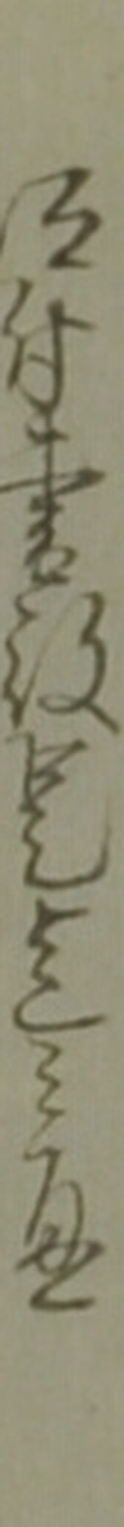仰付書役是迄之通
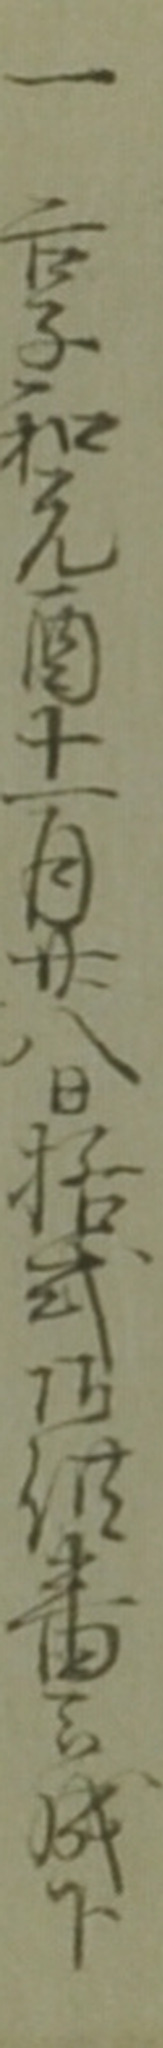一享和元酉十一月廿八日格式御供番被成下
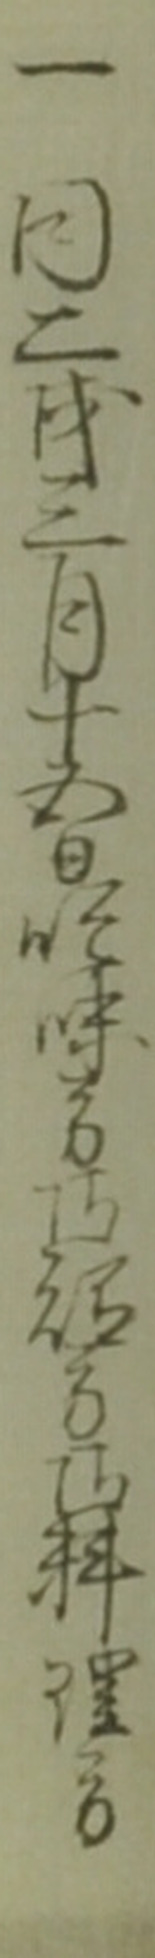一同二戌三月十五日吟味方御賄方御料理方
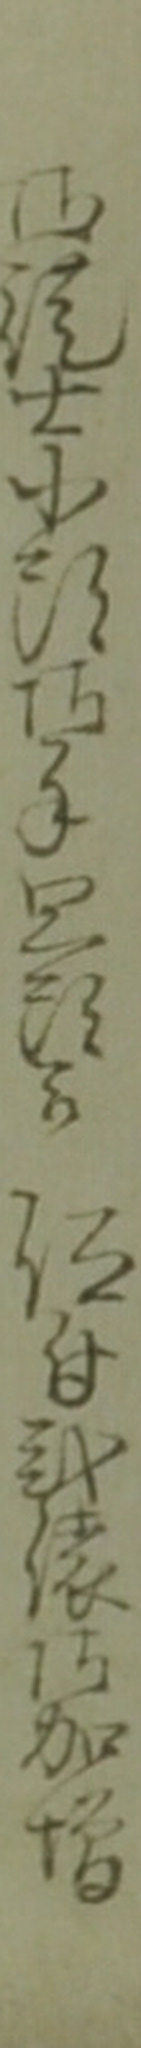御徒士小頭御手廻頭被仰付弐俵御加増
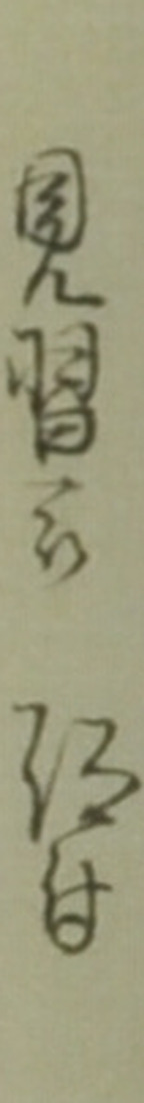見習被仰付

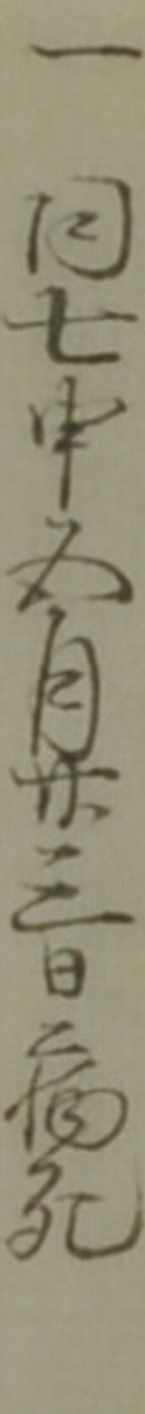一同七申五月廿三日病死
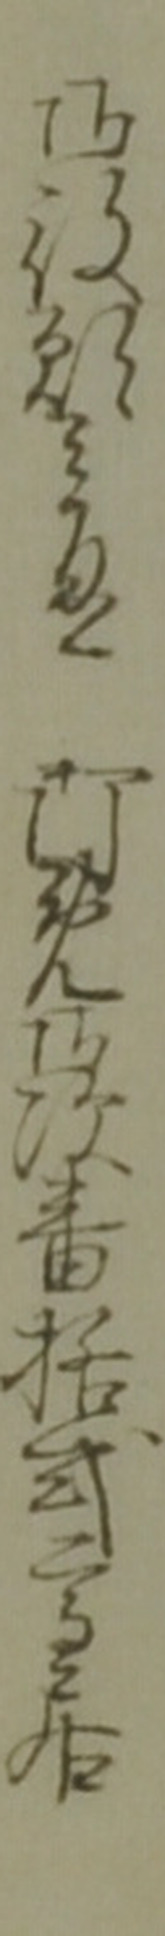御役願之通御免御次番格式高居
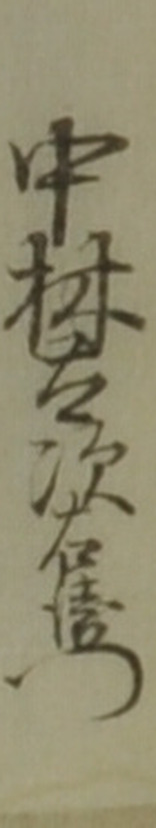中林太次右衛門
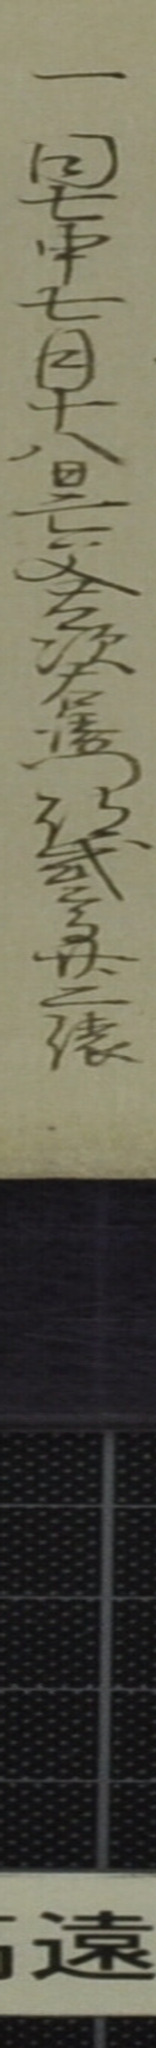一同七申七月十八日亡父太次右衛門跡式高廿二俵
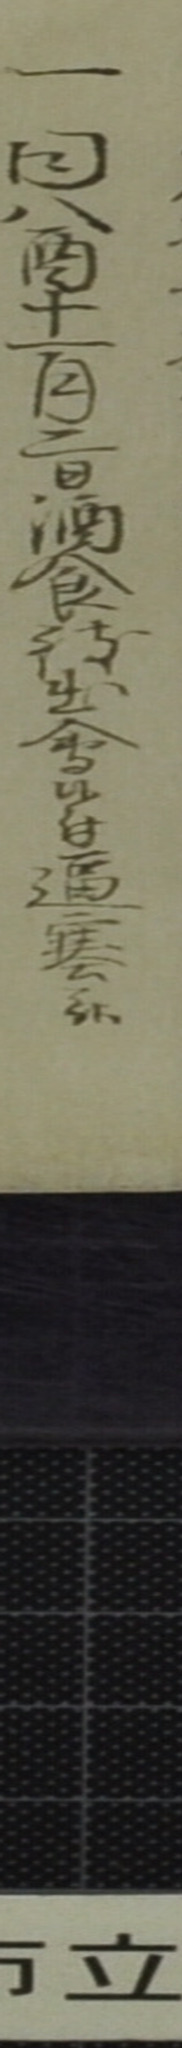一同八酉十一月二日酒食銭出会候付逼塞被
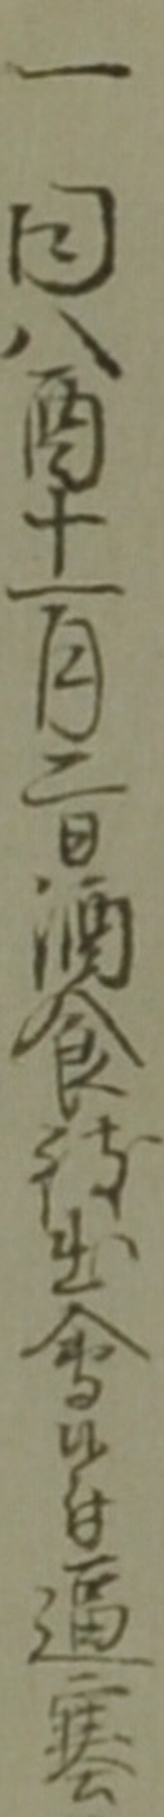一同八酉十一月二日酒食銭出会候付逼塞被
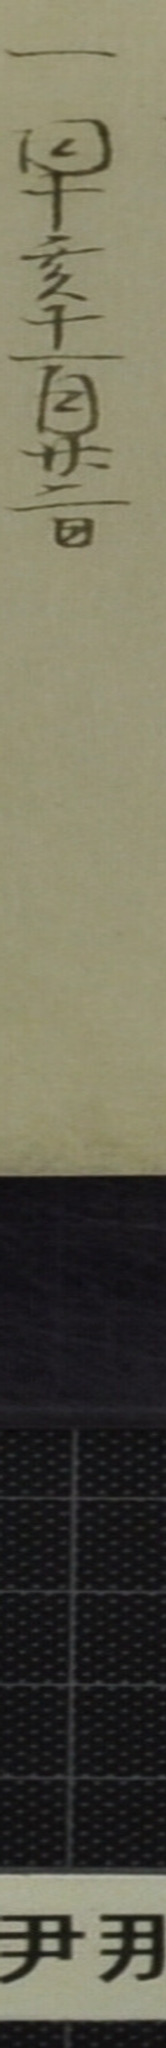一同十亥十一月廿二日
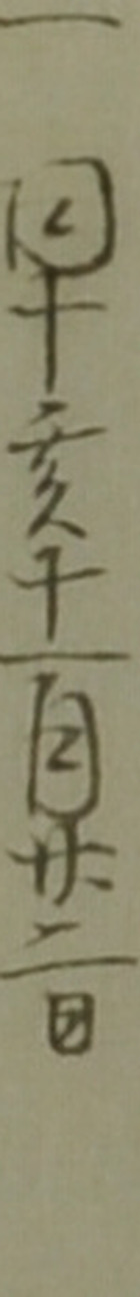一同十亥十一月廿二日
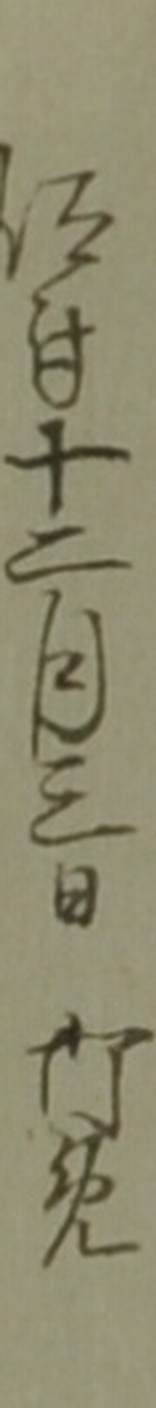仰付十二月三日御免
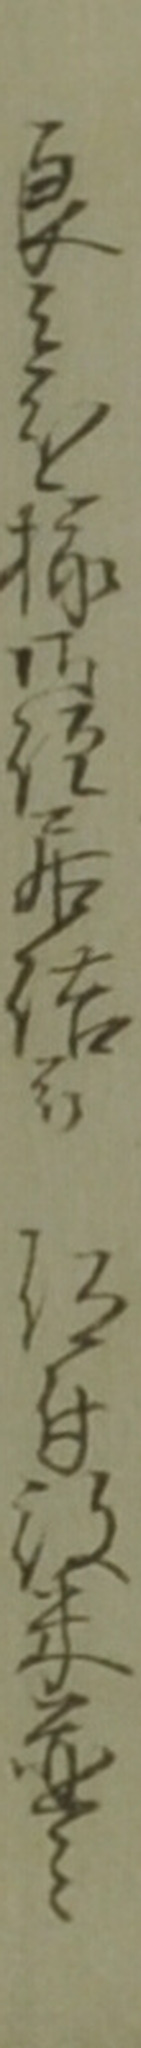良之進様御住居詰被仰付役米並之
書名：無足諸士勤仕録（三）
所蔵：伊那市立高遠町図書館・合同会社AMANE
